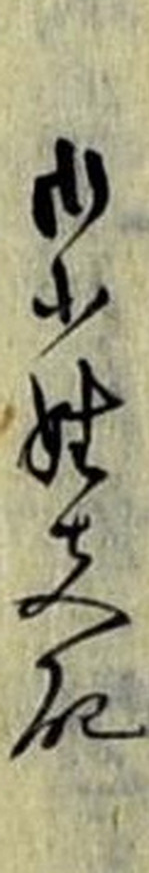御小姓支配
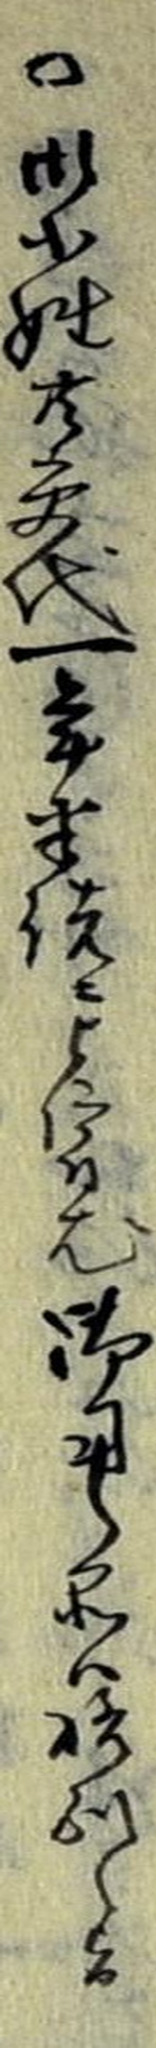〇御小姓共交代一年半詰に被仰付尤御用之品は格別之旨
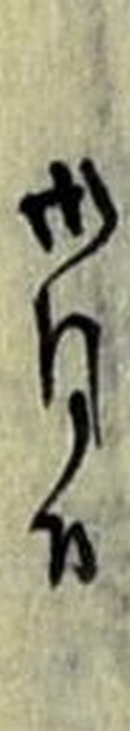御目付
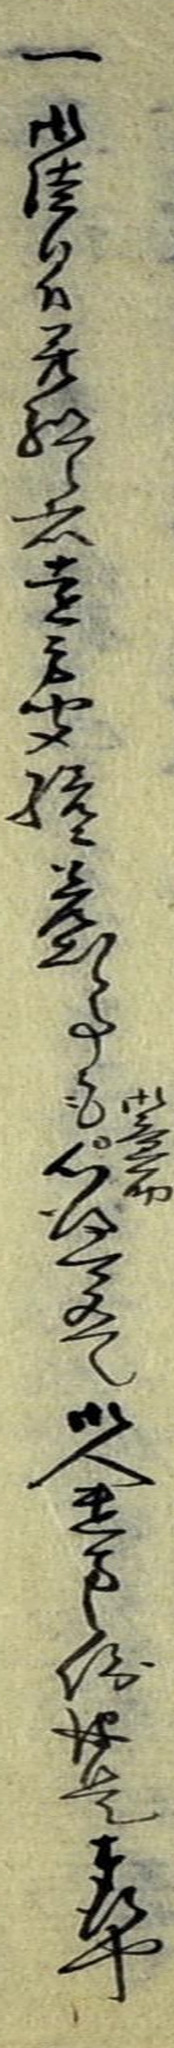一御徒目付并組之者遠方聞繕に差出候にも〇御益筋心得可有之御人遣方之儀彼是奉行中
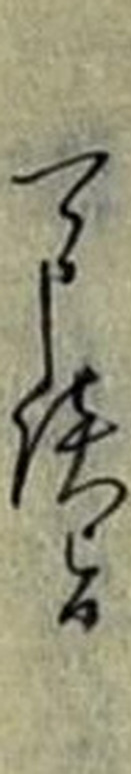可申談旨
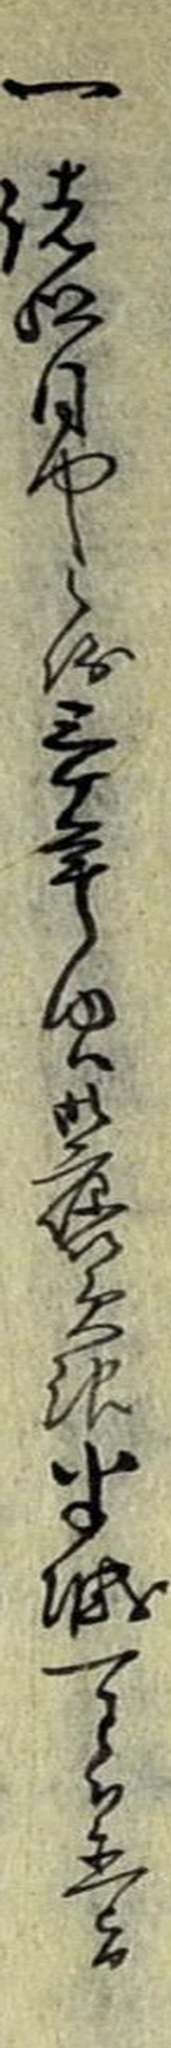一諸組目中之儀三ヶ年之内は御褒美銀半減可被下置旨
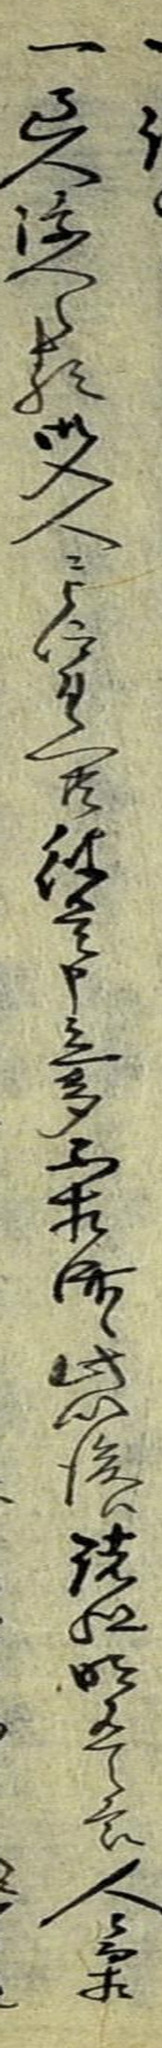一過人浮人之類御入人に被仰付候へ共彼是申立多不相済候此以後は諸組明有之節人に而相
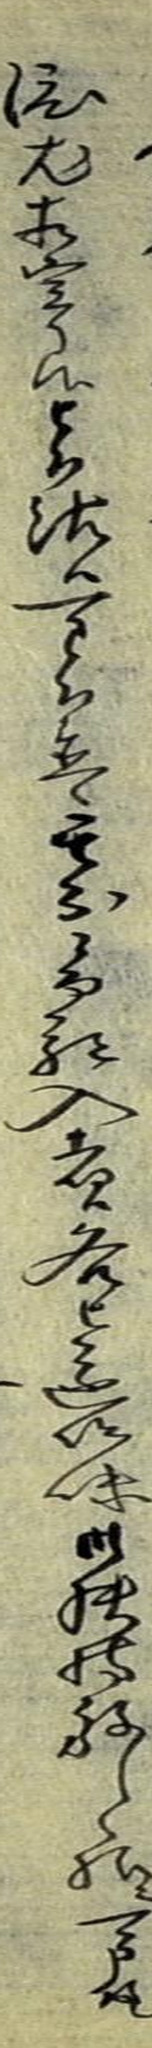渡尤相定り候被下銀は可被下置候其分に而難入者は各被遂吟味御扶持放し候様に可申付候
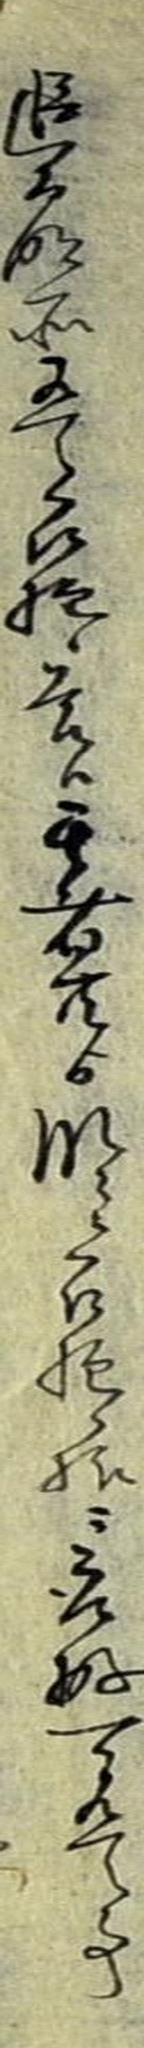追而明所有之召抱候節は其者共ゟ段々に召抱候様に取扱可有之事
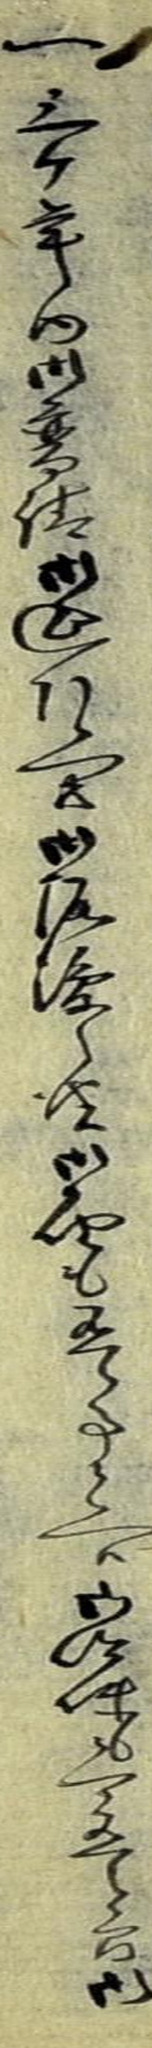一三ヶ年内御普請御延引候へ共御堀浚之儀は御届も有之事に候へは御吟味も可有之候間御
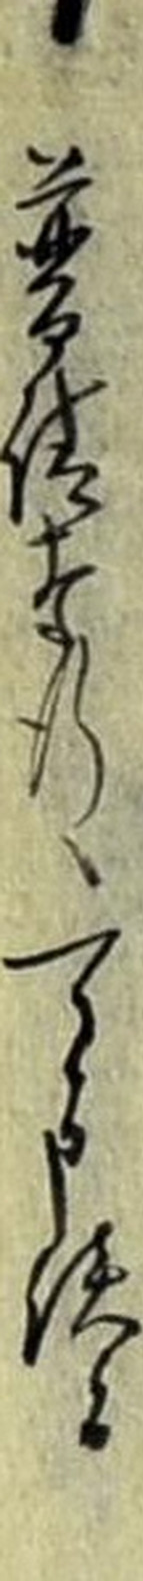普請奉行へ可被申談旨
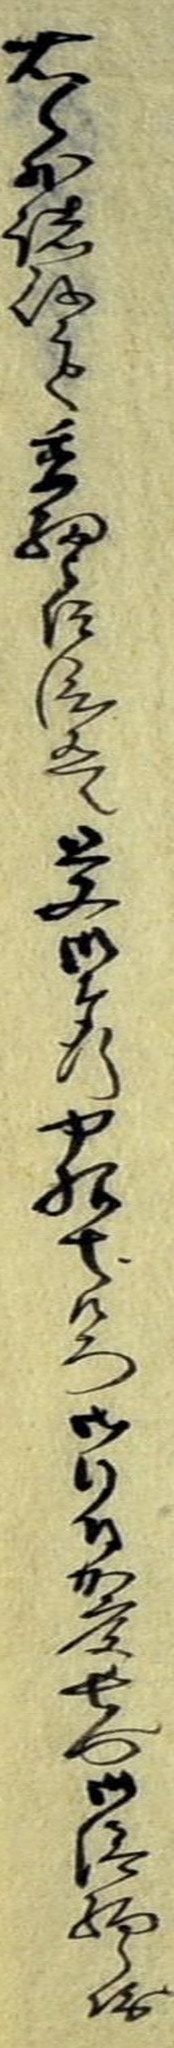右之外諸役方へ委細被仰渡有之且又御奉行中根十郎左衛門御目付加藤長右衛門御倹約之儀

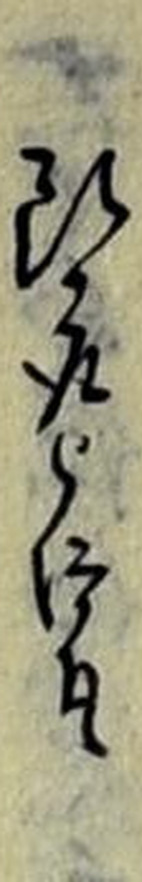頭取被仰付候
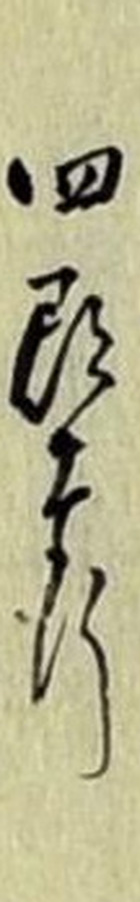四郡奉行
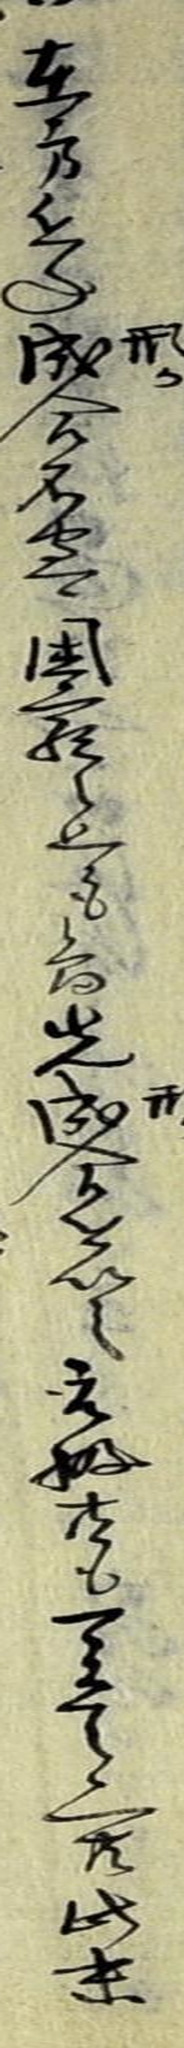〇在方近年成合不宜候困窮之上にも候間先成合を以之取扱共も可有之候へ共此末
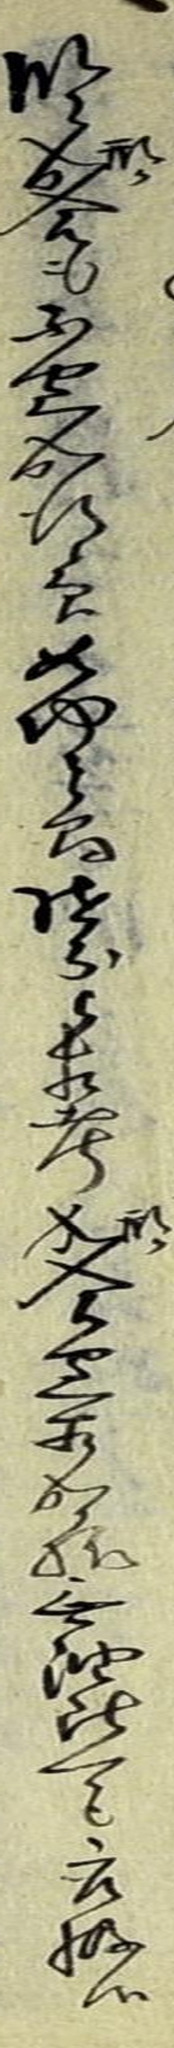段々成合も不宜成行候而は如何に候間随分被相考成合宜相成候様無油断可被取扱候
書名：命令之部 二
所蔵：福井県文書館 Fukui Prefectural Archives
